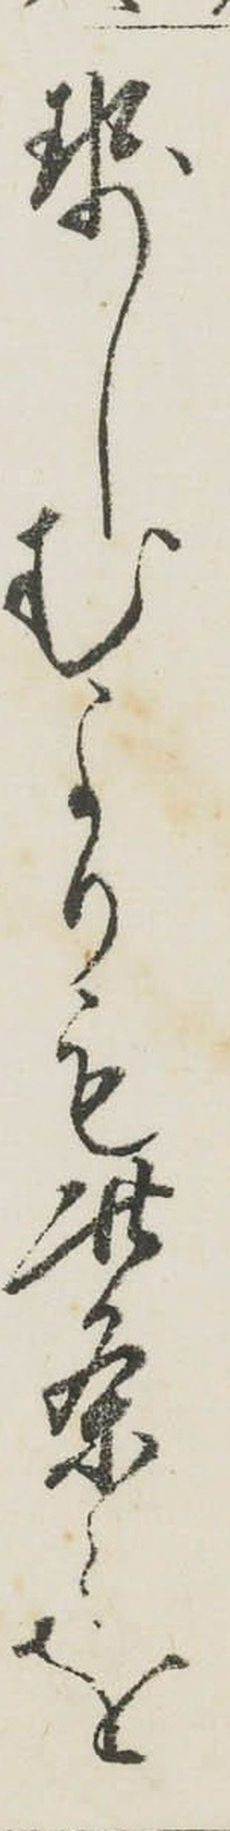せしむよりも此条々を
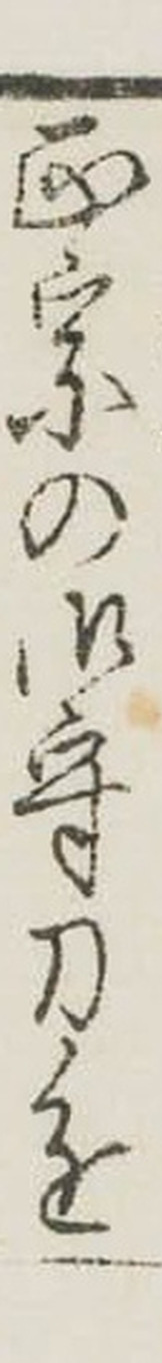政宗の御守刀進
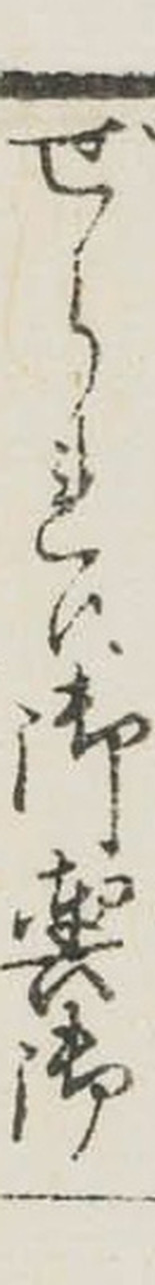ぜられ候御輿御
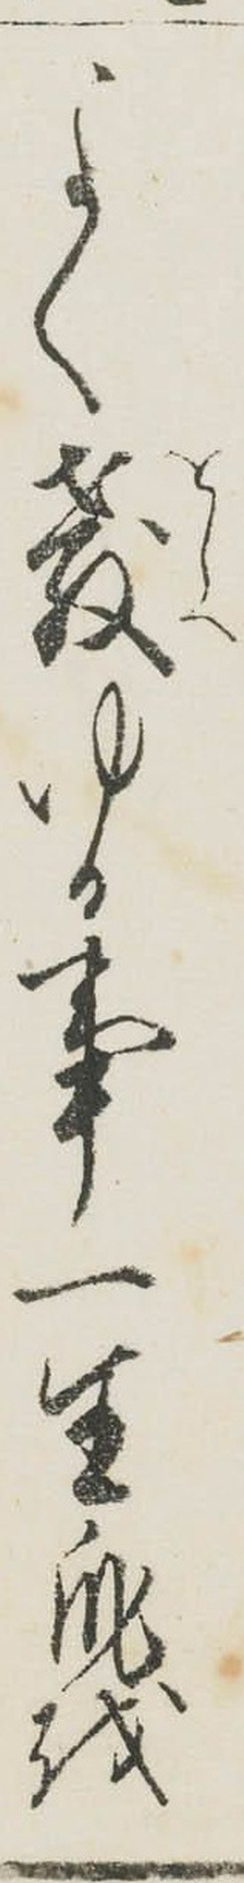よく教ゆる事一生身を
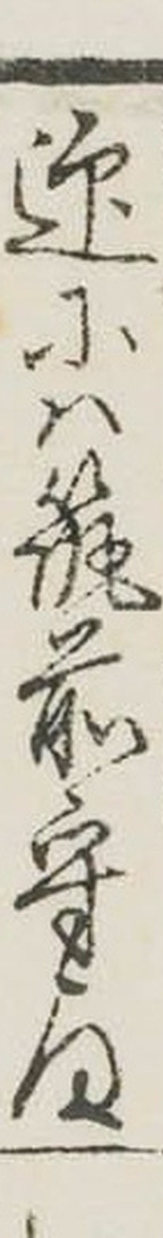迎には筑前守さま
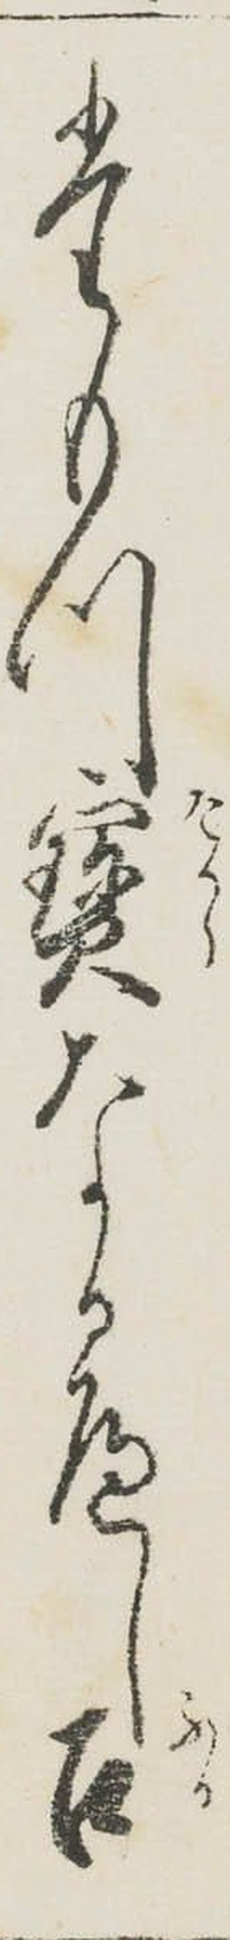たもつ寶なるへし古
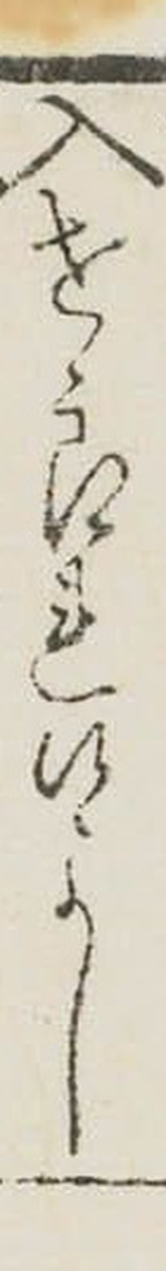入せられ候よし
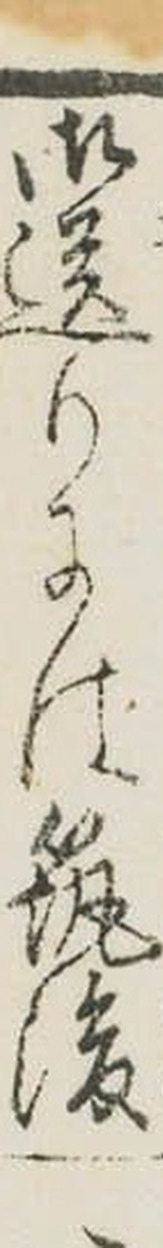御送りには筑後
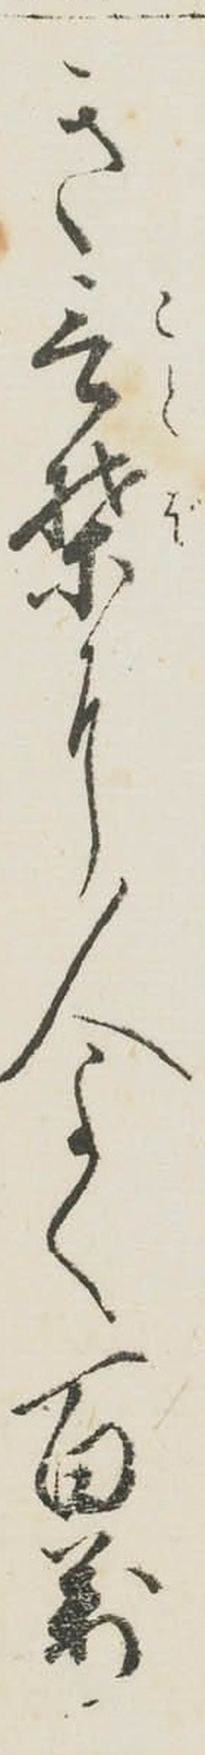き言葉に人よく百萬
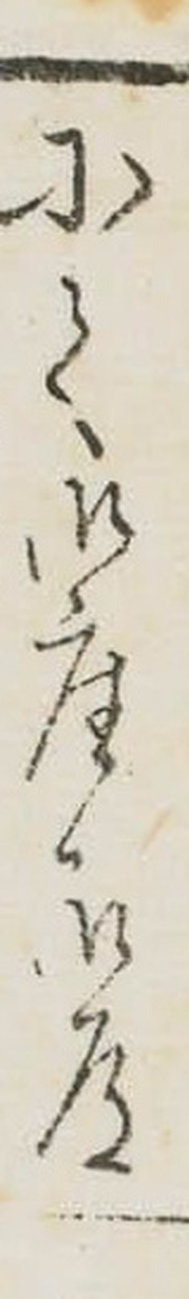にて御座候御道
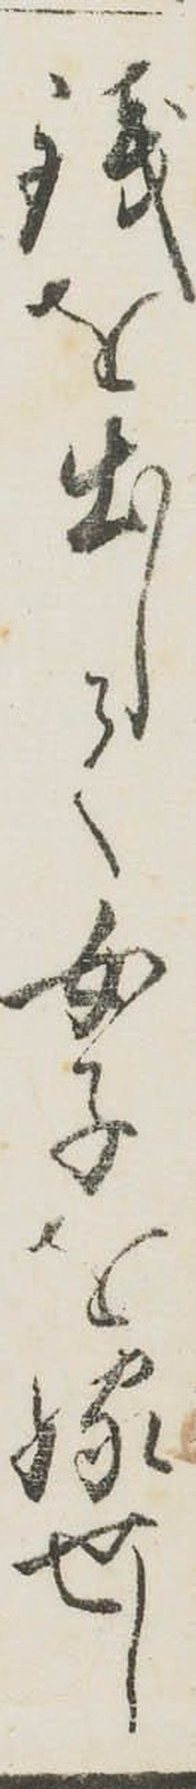銭を出して女子を嫁せし
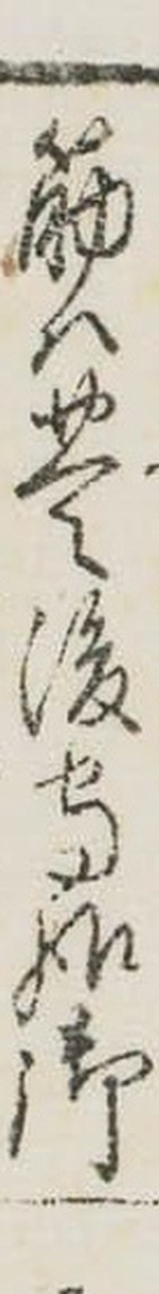筋は豊後守様御
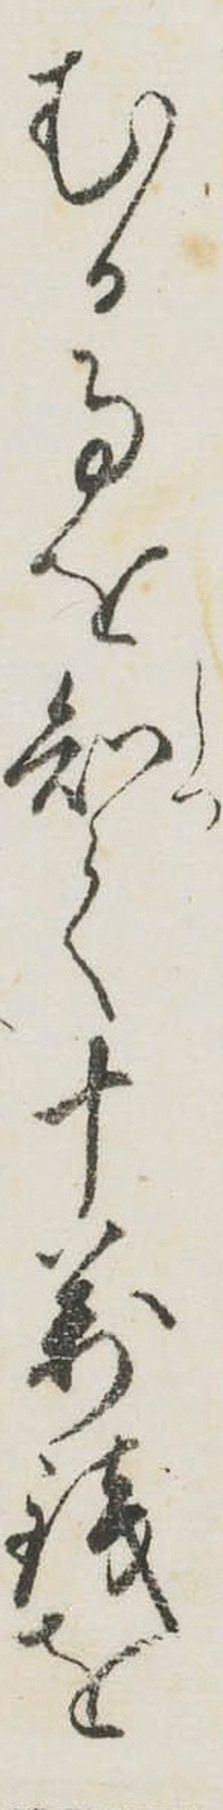むる事を知て十萬銭を
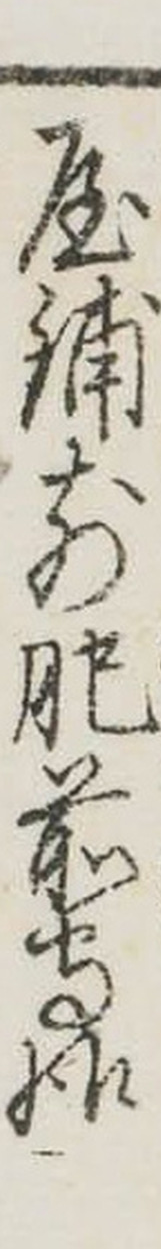屋鋪前肥前守様
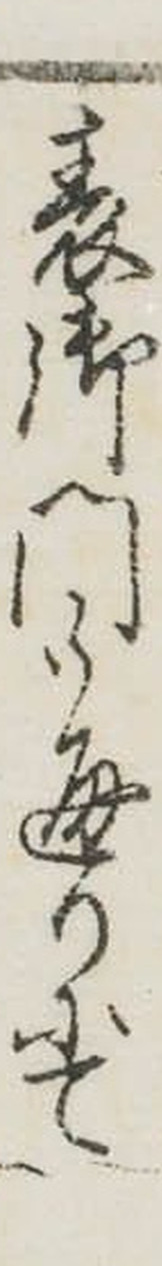表御門御通りにて
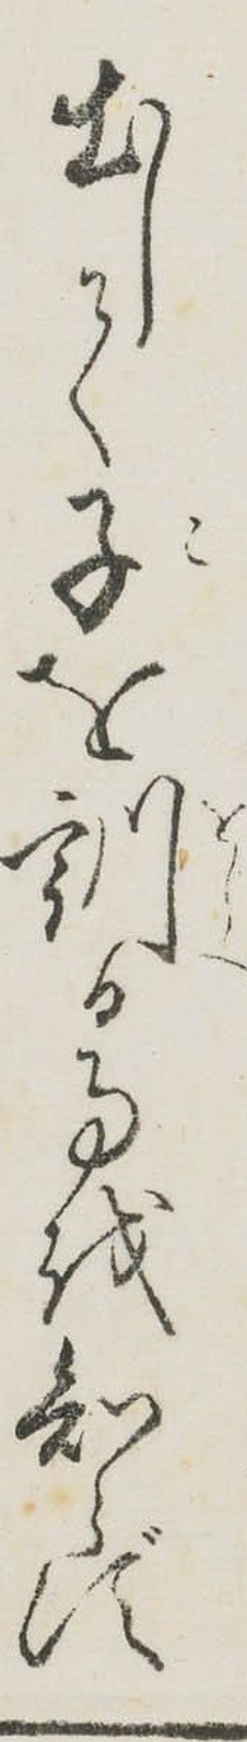出して子を訓る事を知らず
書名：女大学
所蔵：東京学芸大学教育コンテンツアーカイブ
